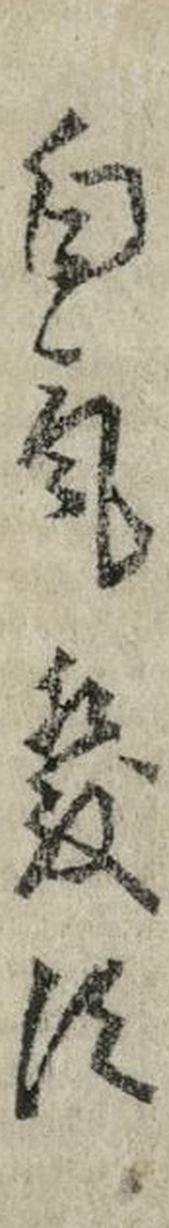白気発す
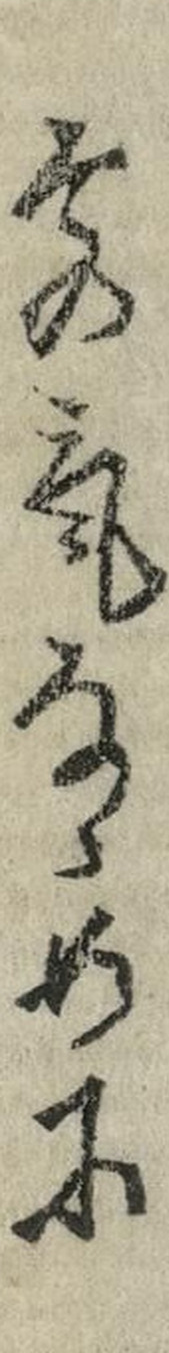その気なゝめに
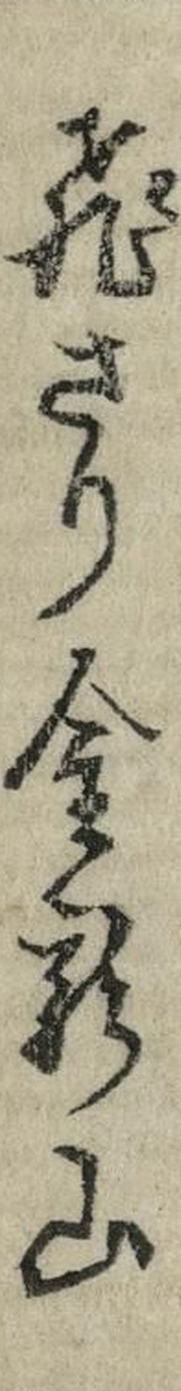飛さり金龍山
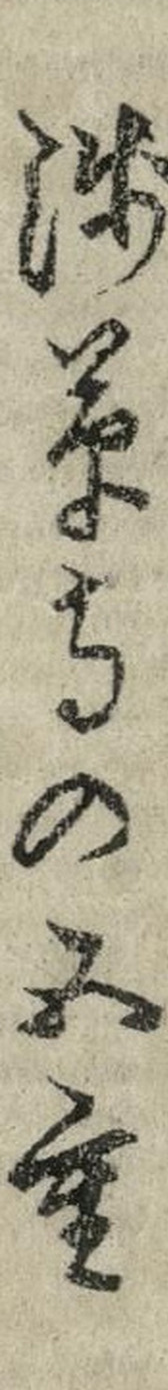浅草寺の五重
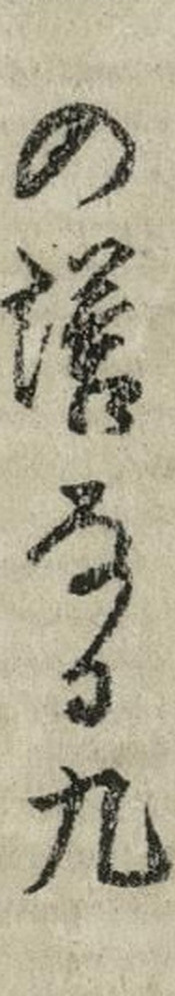の塔なる九
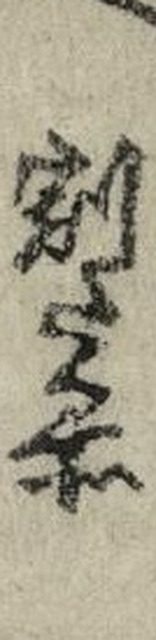割たる所
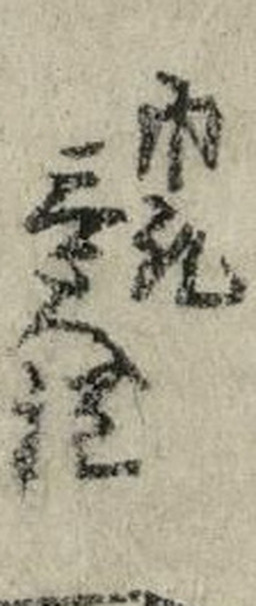三尺程
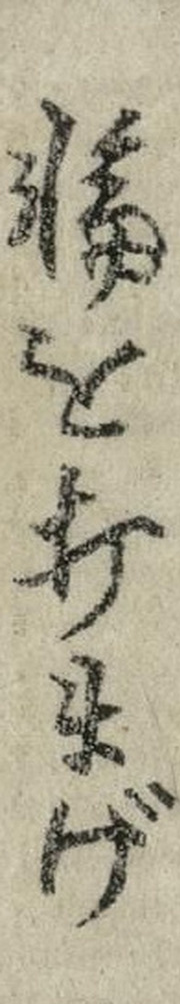輪を折まげ
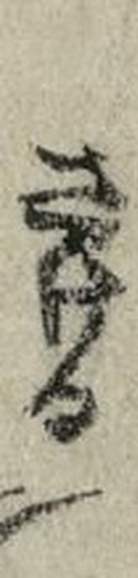さける
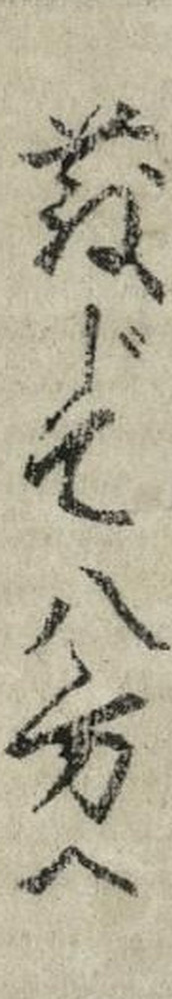散じて八方へ
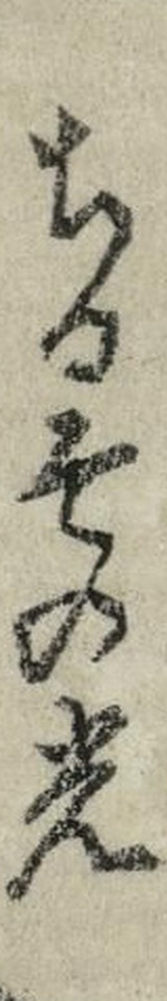ちるその光
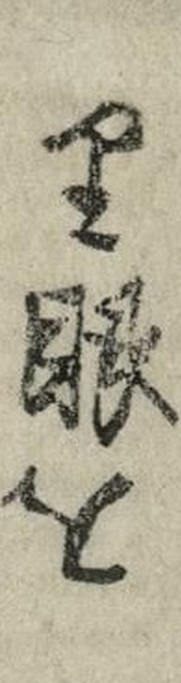り眼を
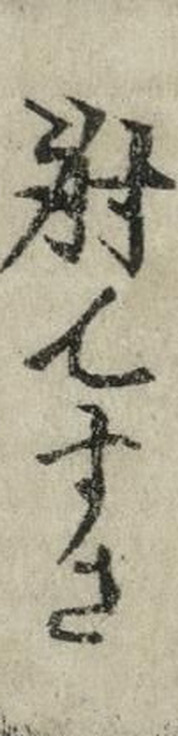射てすさ
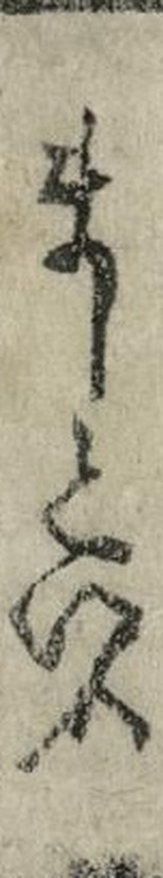ましといふ

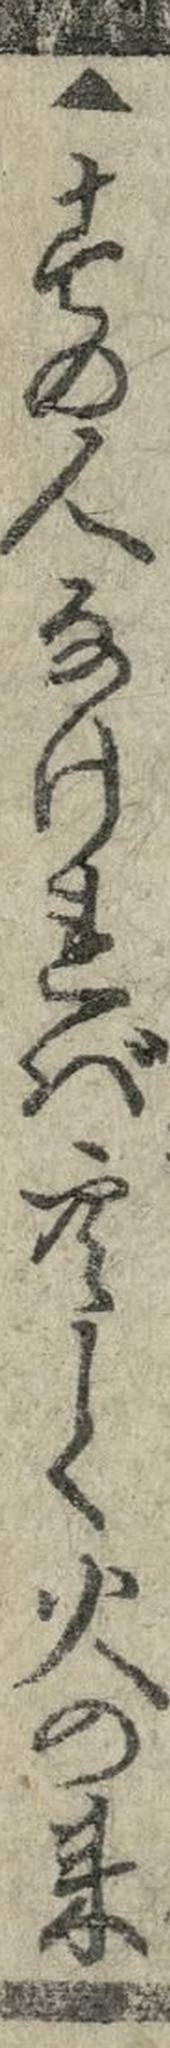▲すの人なければ虚しく火の来
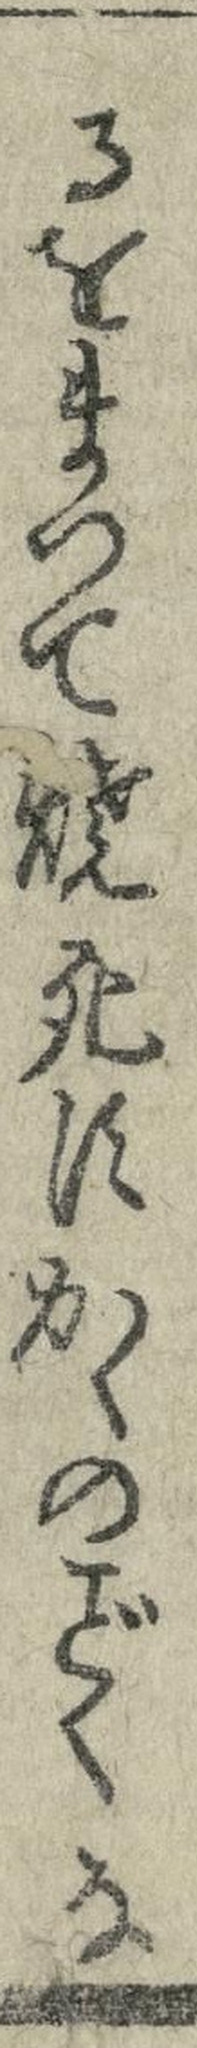るをまつて焼死すかくのごとくな
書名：江戸　大地震末代噺の種　全
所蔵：東京大学地震研究所図書室 Earthquake Research Institute Library, The University of Tokyo, JAPAN
